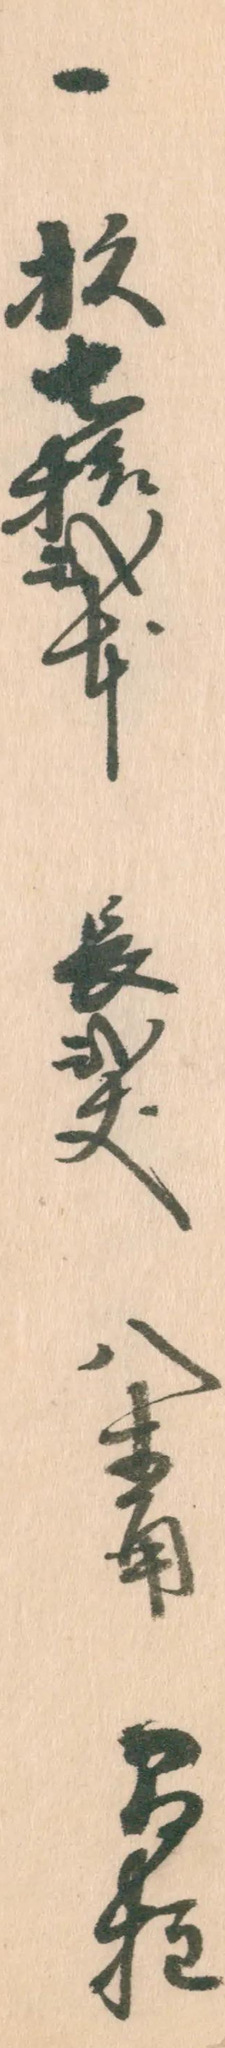一杉七拾弐本長弐丈八寸角間柱

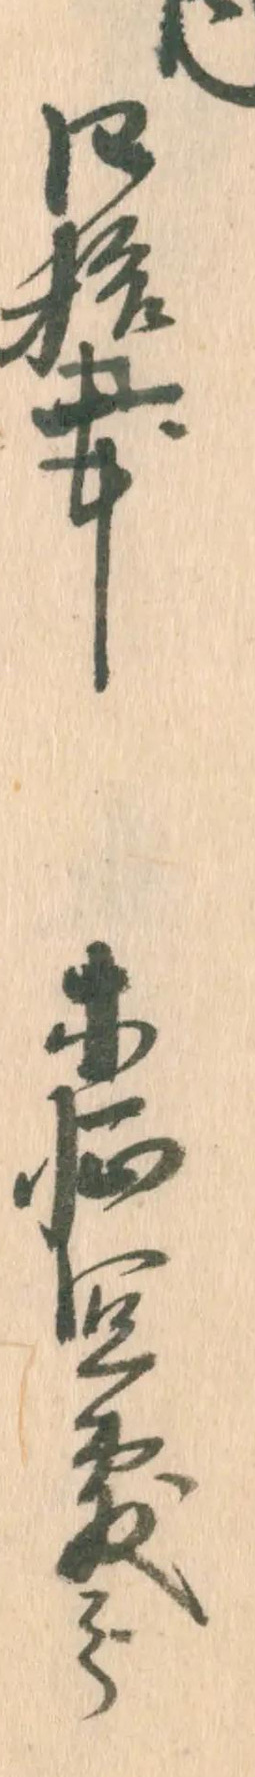内四拾五本木怔宜敷分
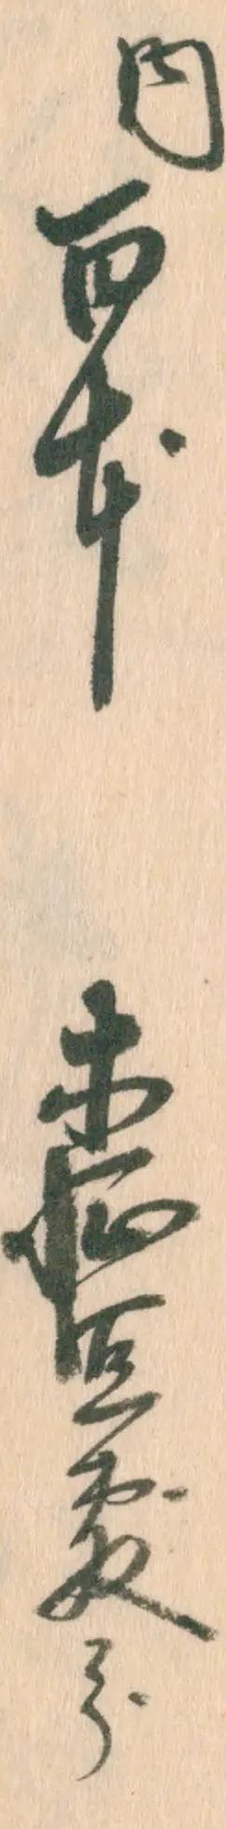内百本木怔宜敷分
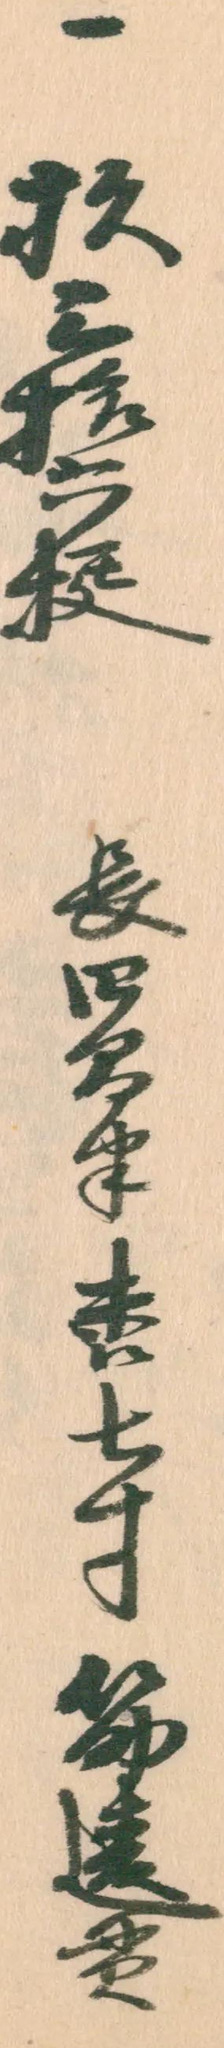一杉三拾六挺長四間半末口七寸筋違貫
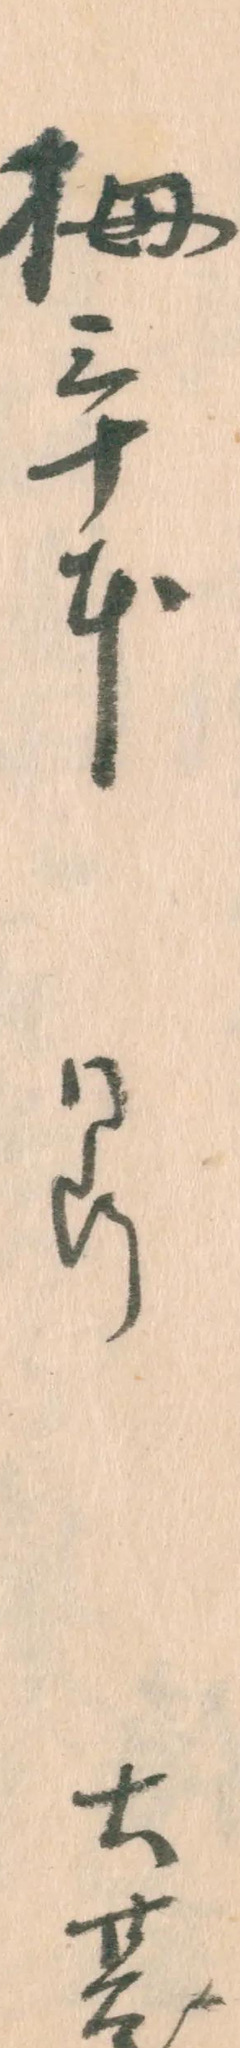一栂三十本同断土台

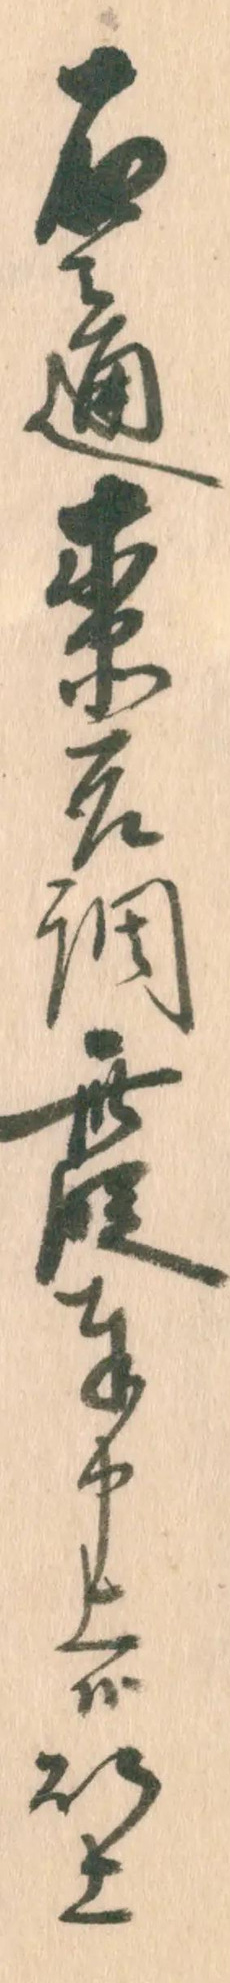右之通木品取調此段奉申上候以上
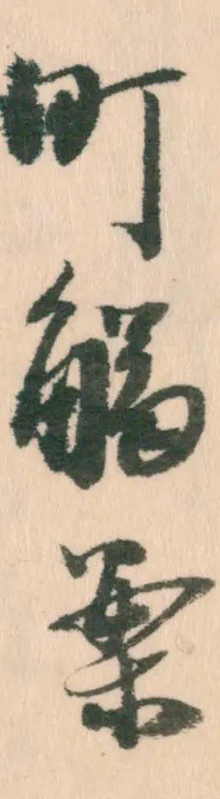町触案
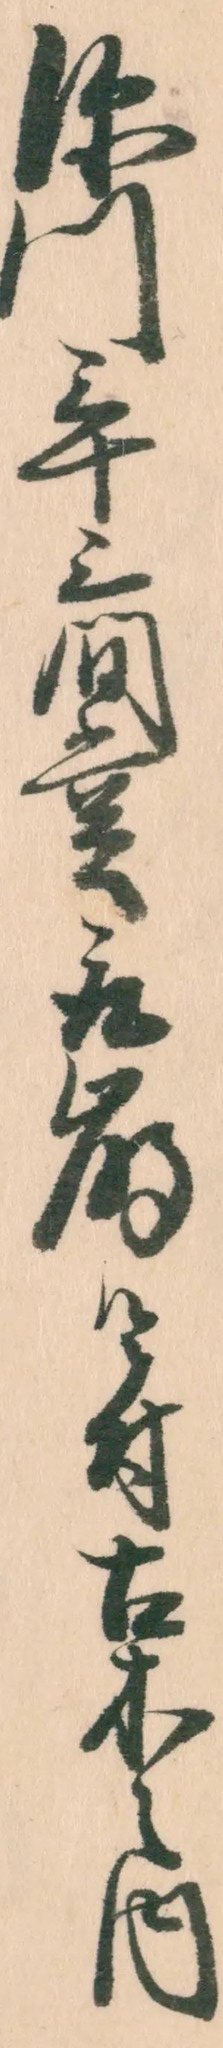深川三十三間堂取崩候ニ付古木之内
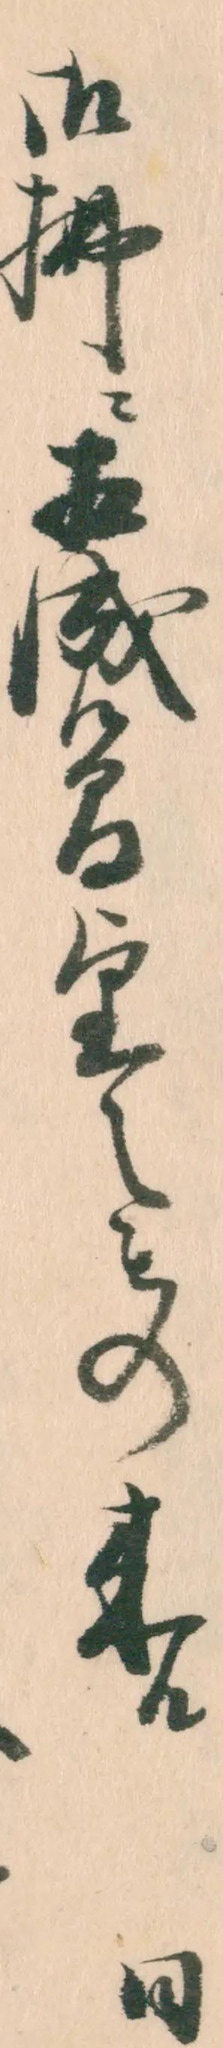御払ニ相成候間望之もの来ル日
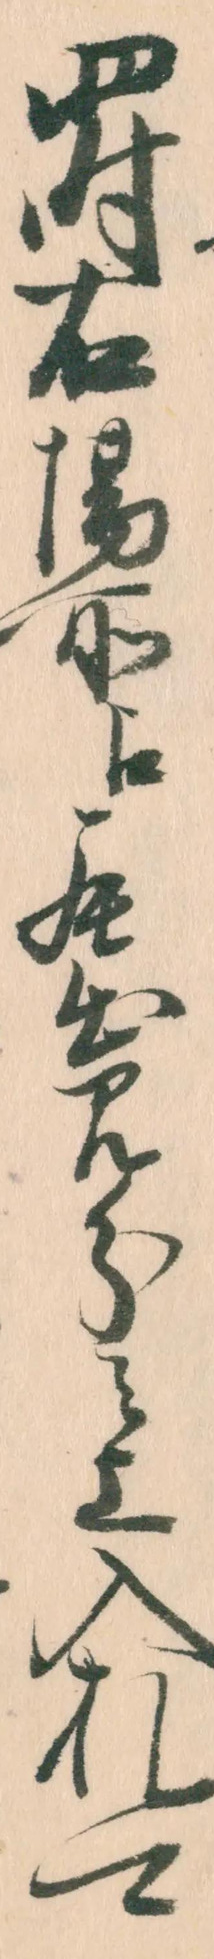四時右場所え罷出見分之上入札可
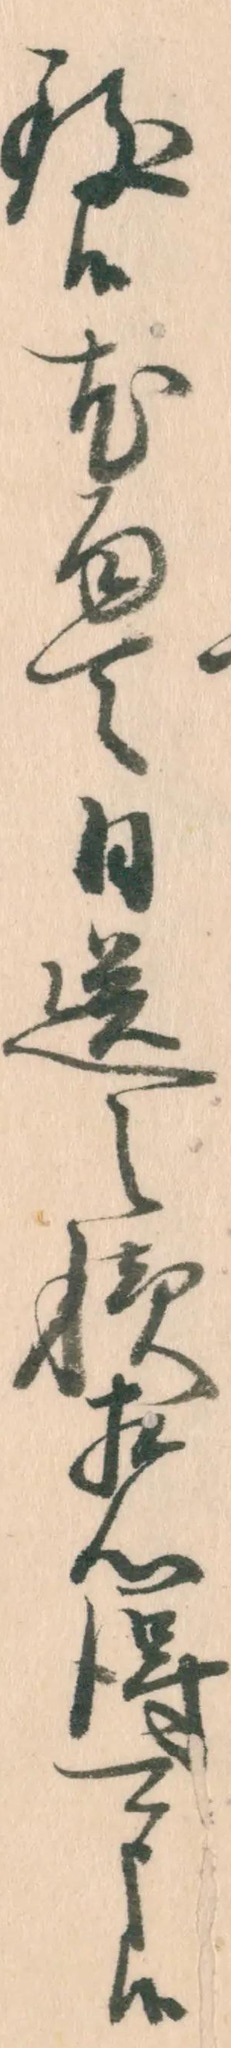致候尤雨天日送之積相心得可申候
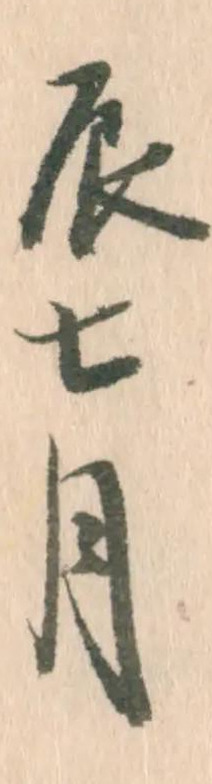辰七月

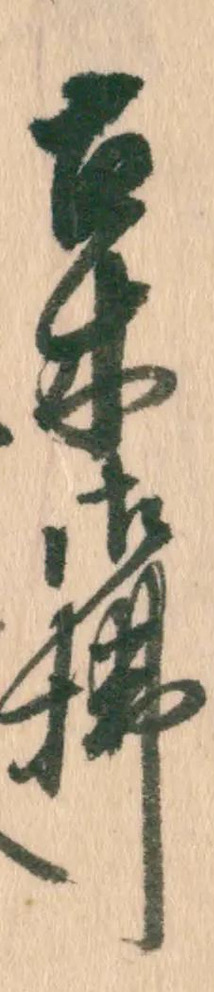古木御払
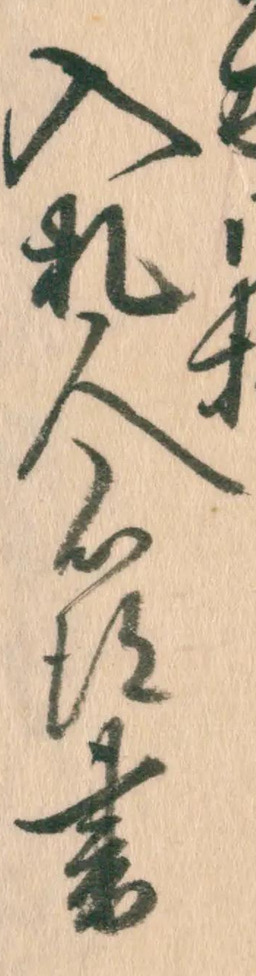入札人心得書
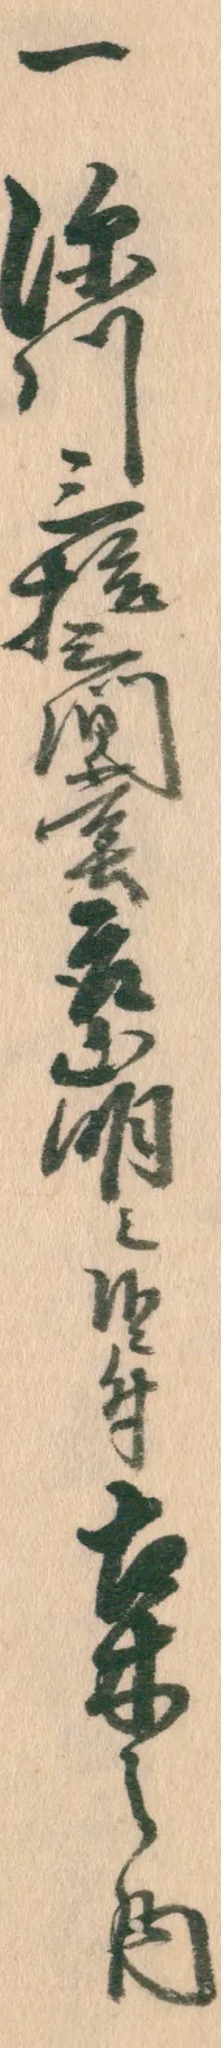一深川三十三間堂取崩し候ニ付古木之内
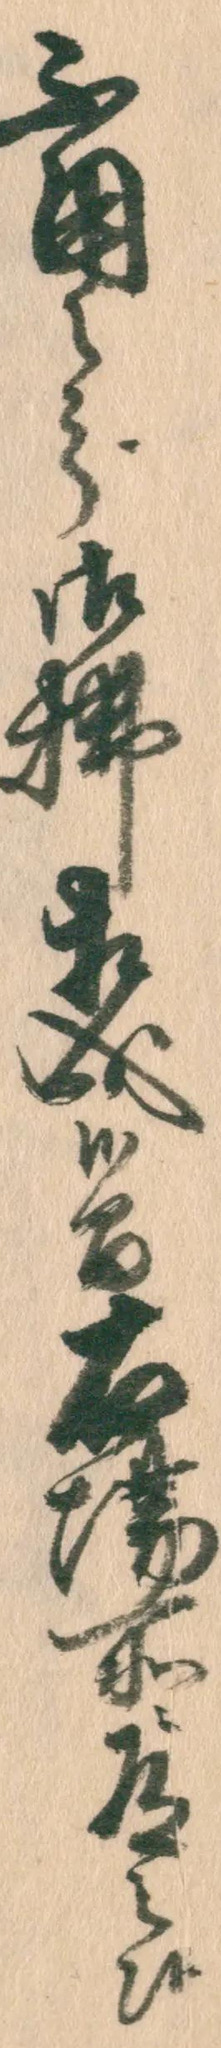不用之分御払相成候間右場所ニ有之候
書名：三十三間堂. [2]
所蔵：国立国会図書館 National Diet Library, JAPAN
